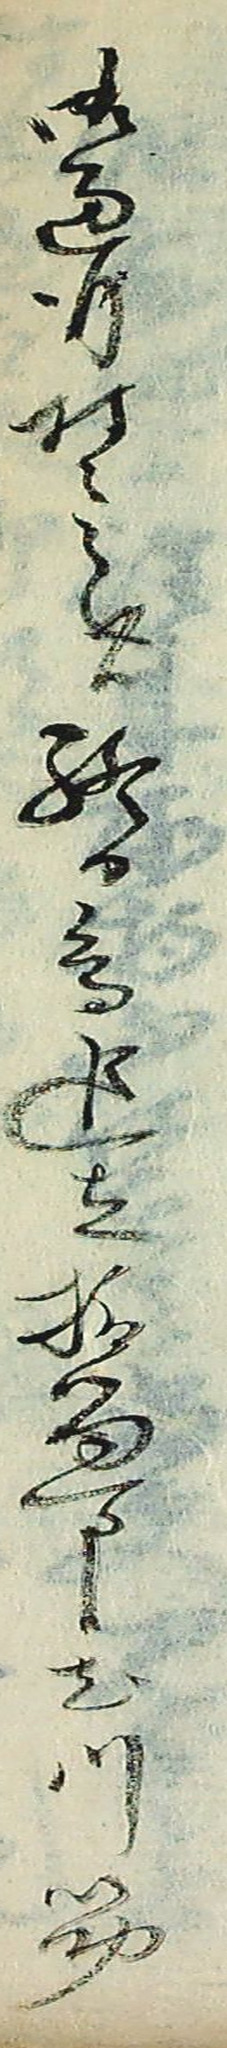御通行村々之義ハ終日鳥追立指留可申尤川筋
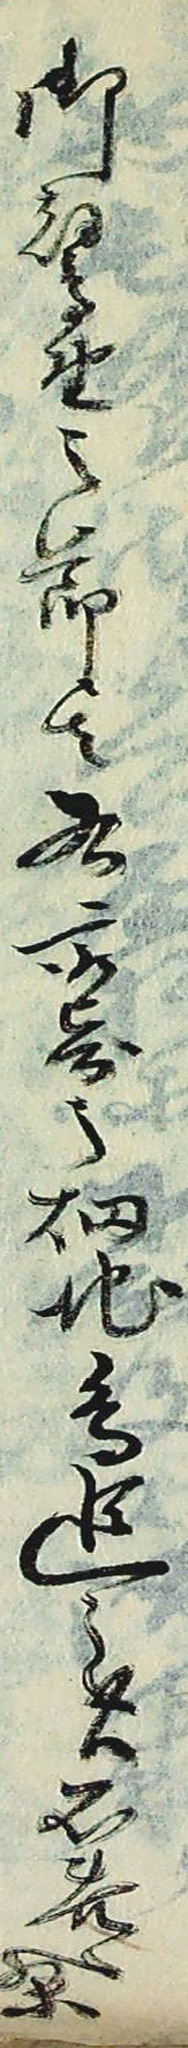御鷹野之節者右最寄之畑地鳥追之義ハ不苦候条
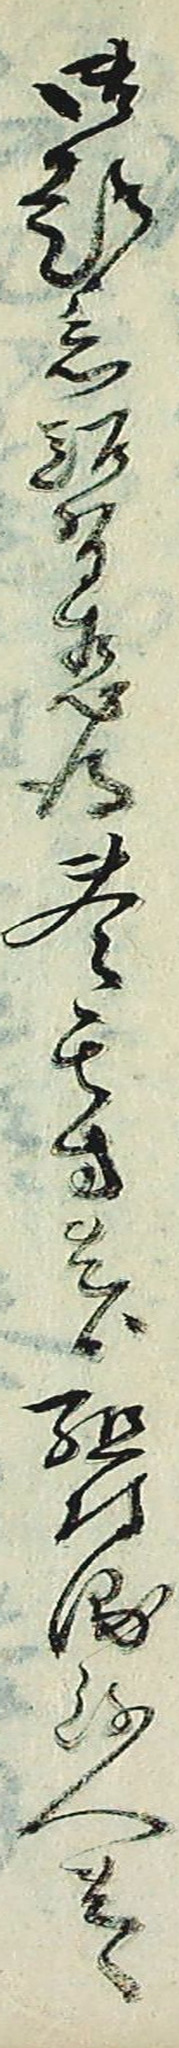御趣意難有相心得夫々其方共ゟ組村浦役人共へ
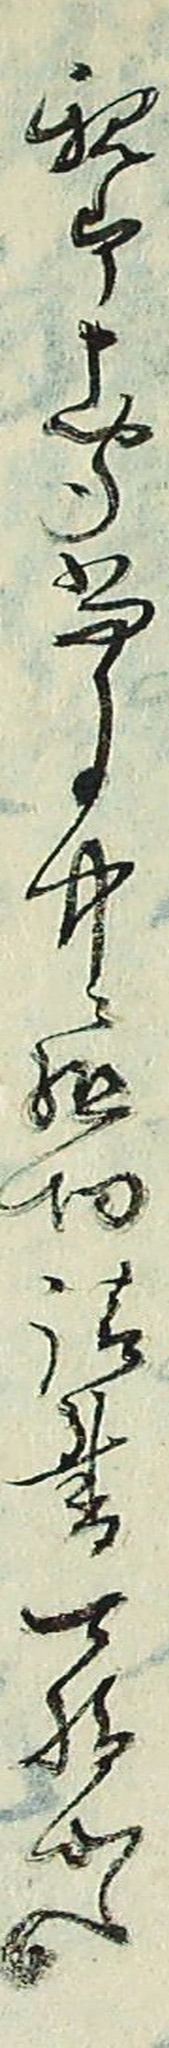親布申聞當月中ニ組切請書可指出候以上
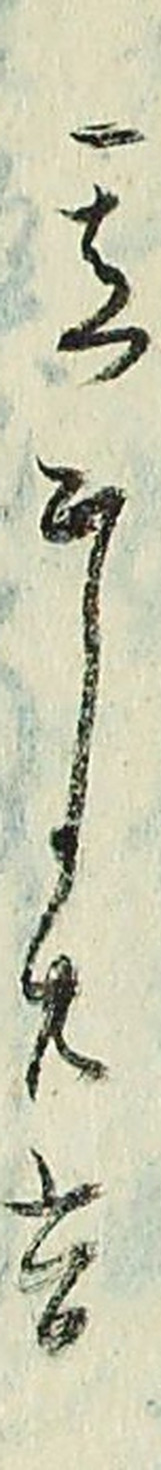亥正月廿六日
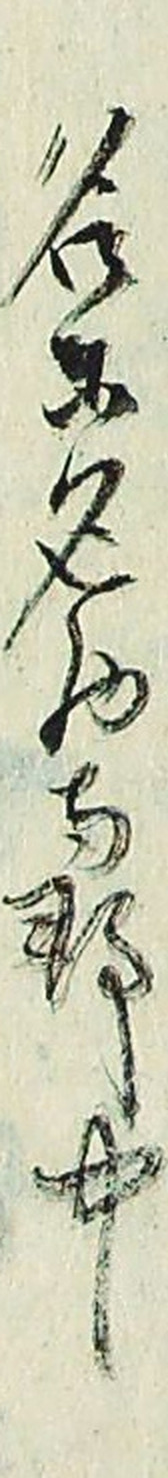名東名西両郡中
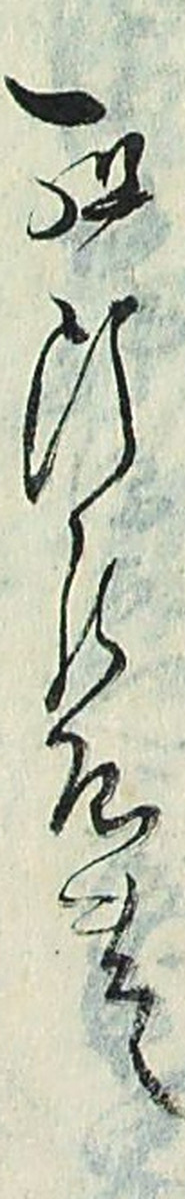組頭庄屋共へ
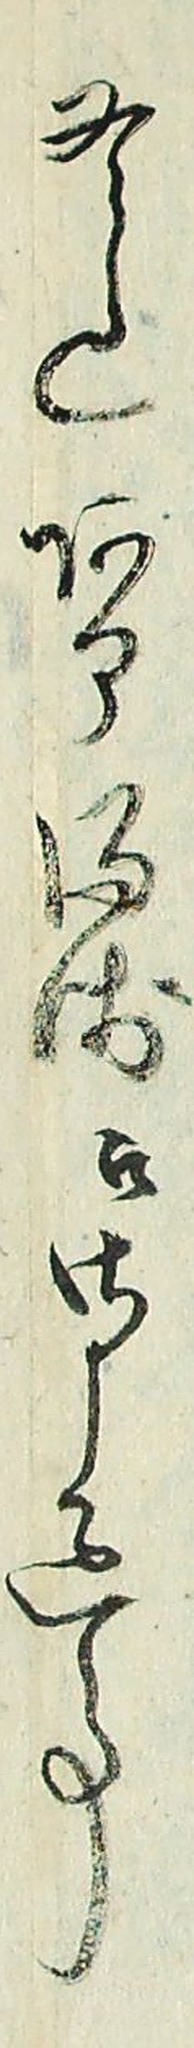右之通阿部湯浅江御申達事

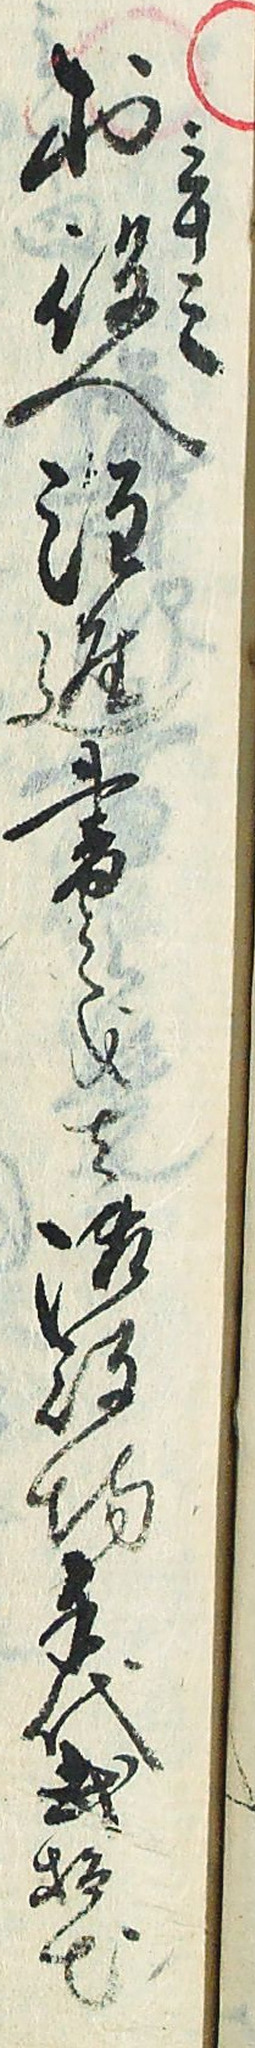村役人注進書之義者御役場手代當指出
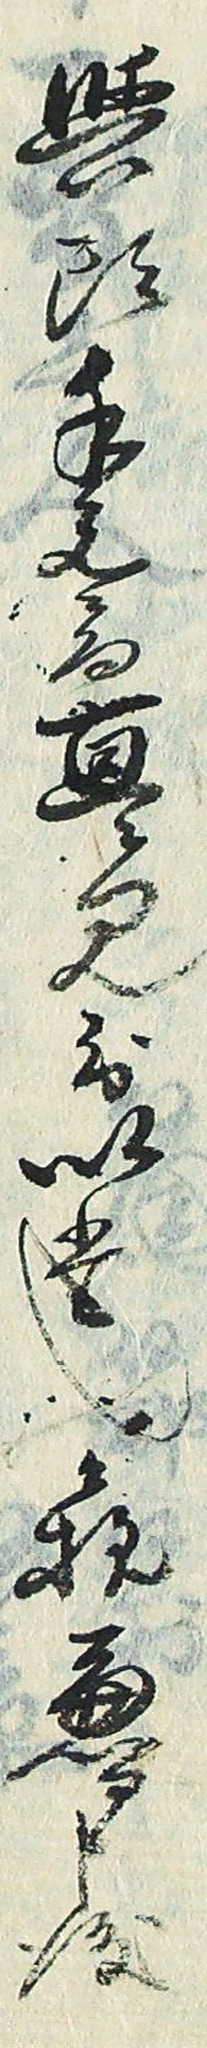與頭手許ニ而直ニ見分いたし候様兼而申渡
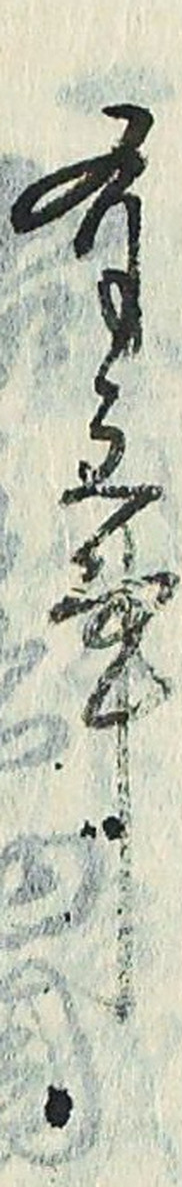有之事
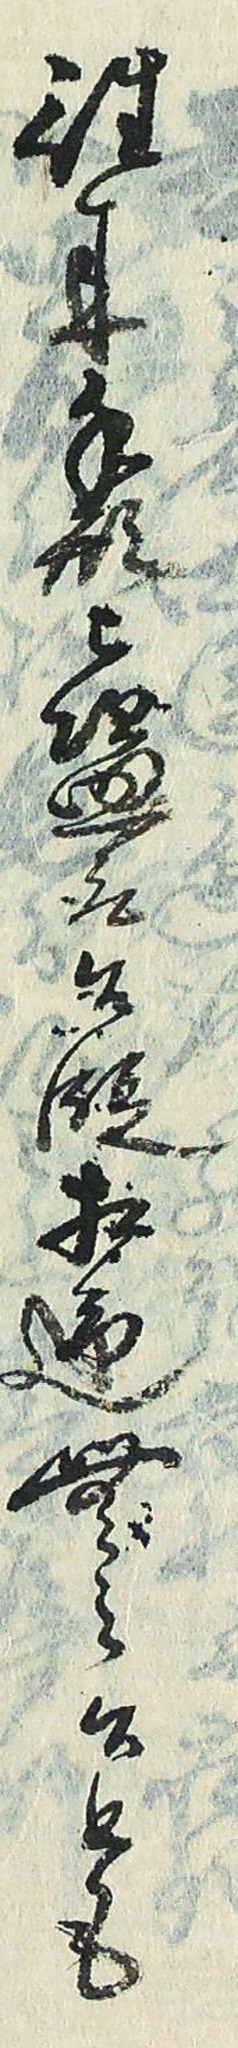往来手形被盗取候段相違無之候とも
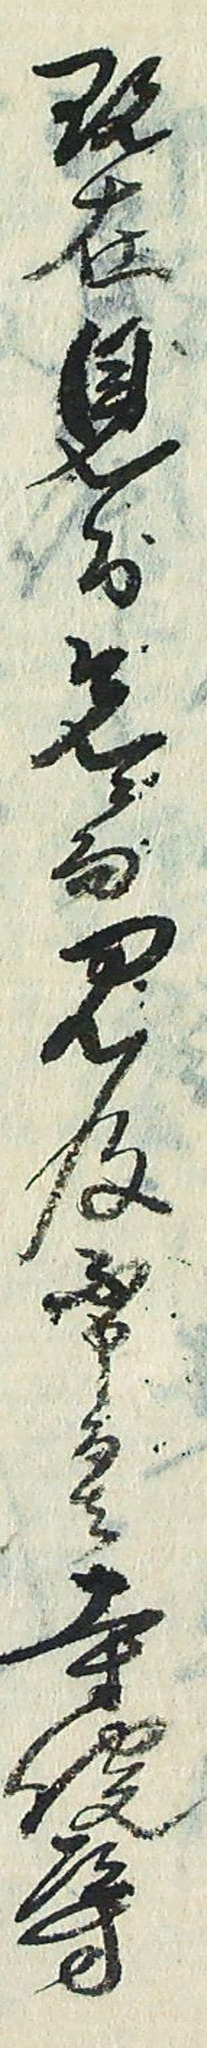現在見分先ニ而見及不申而者寺院導
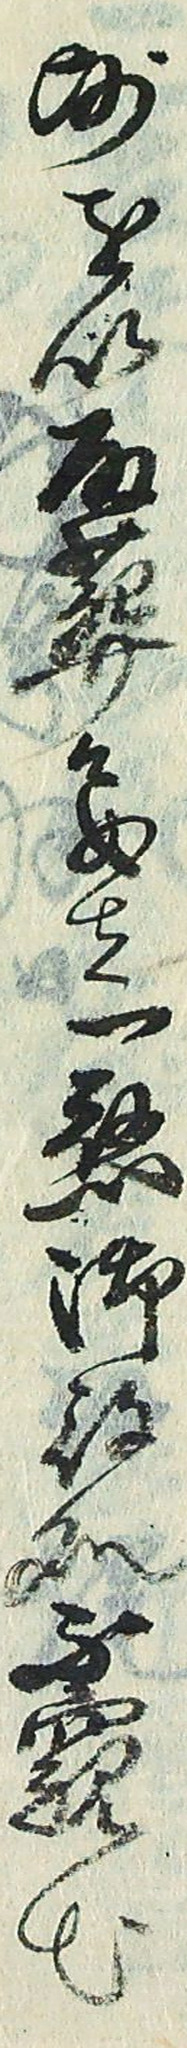師を以取葬候義者一應御役処不窺出
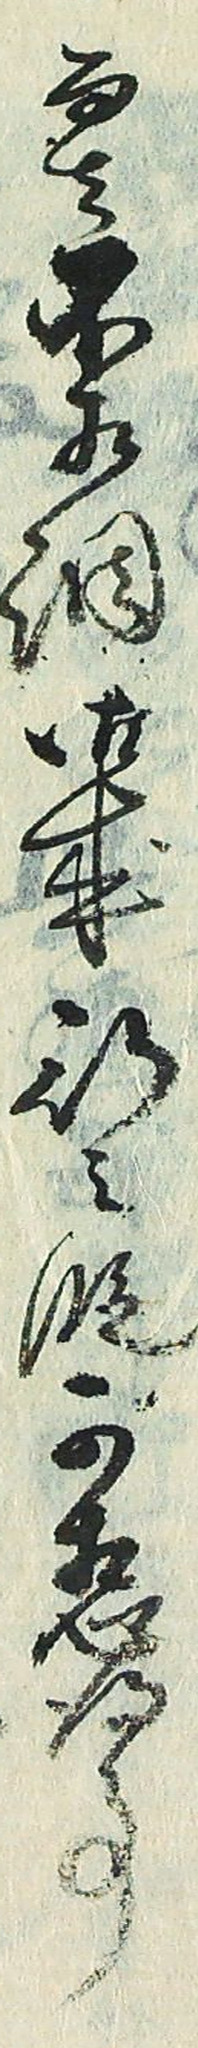而者不相調御成行之段可相心得事
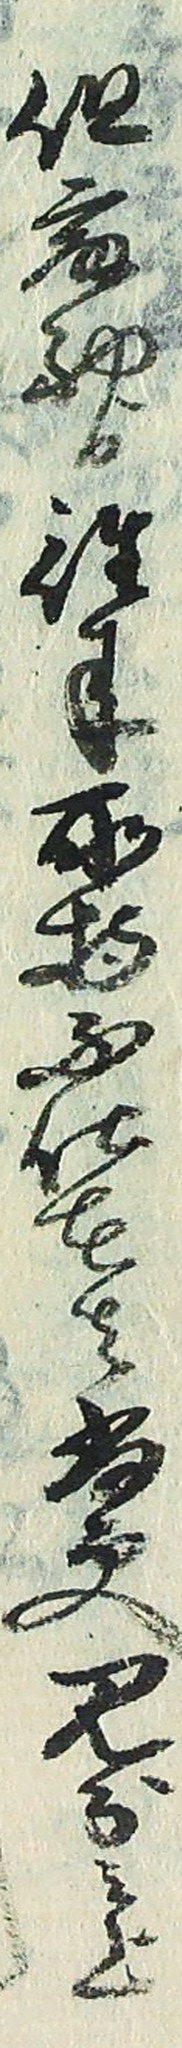但最初ゟ往来所持不仕者者尚更見分之上
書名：諸御趣意書并御下知向之写
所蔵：鳴門教育大学 Naruto University of Education
